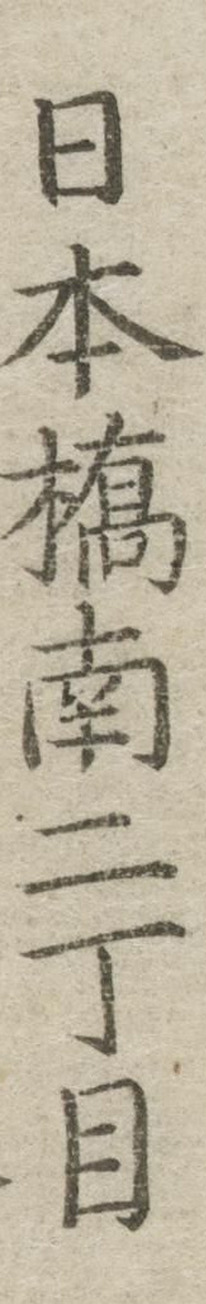日本橋南二丁目
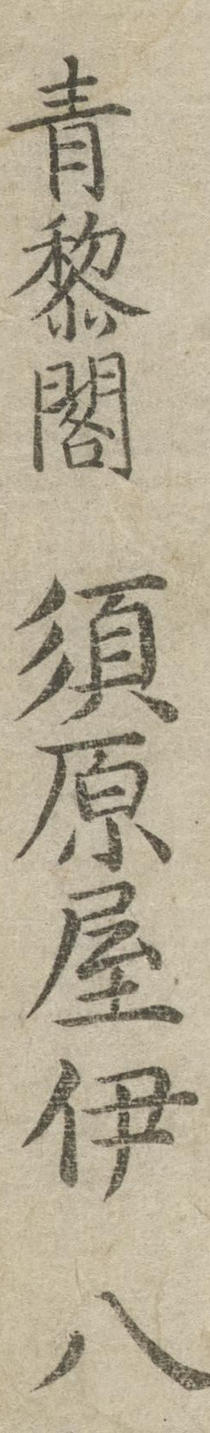青黎閣須原屋伊八
